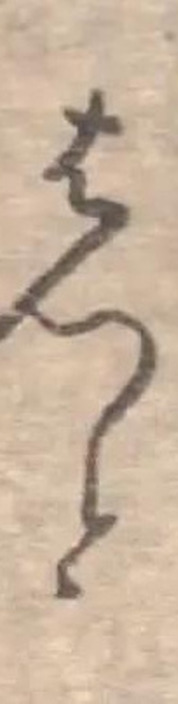はつと
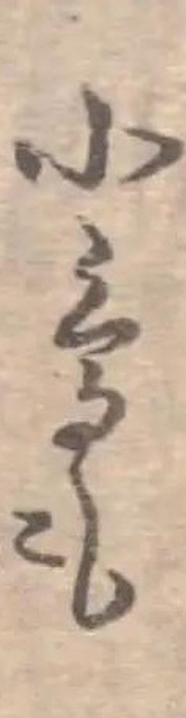小鳥も
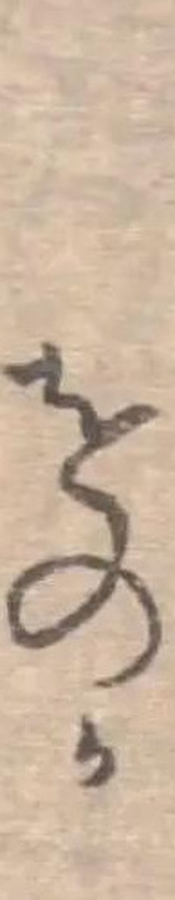をのか
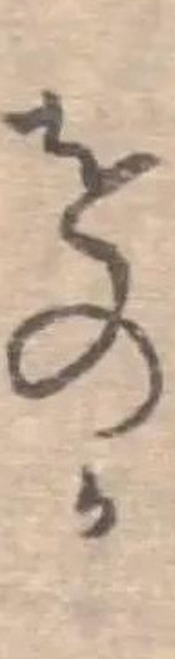をのか
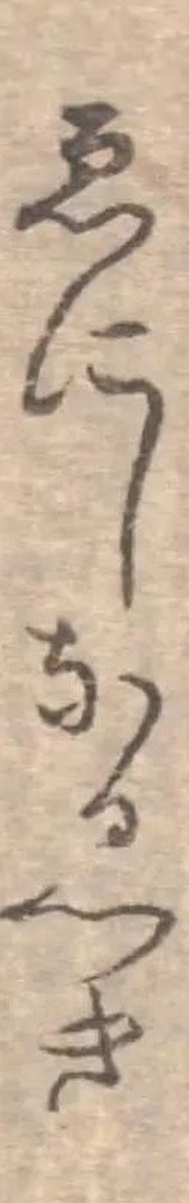ゑにしなるへき
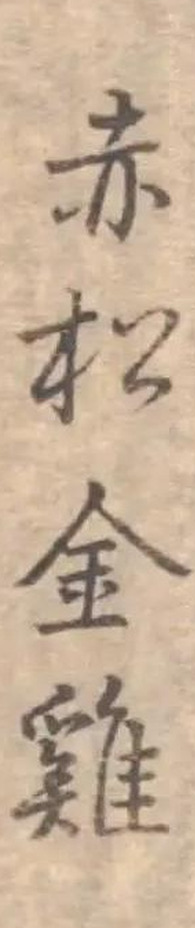赤松金鶏
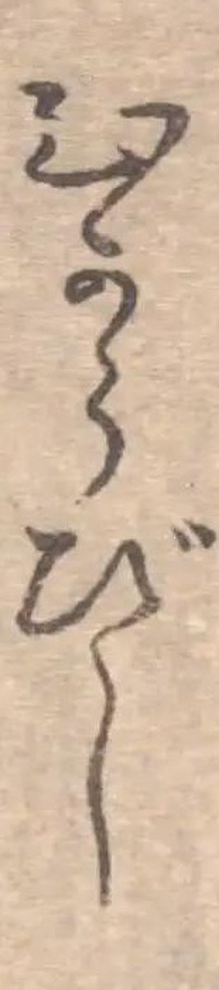ひからびし
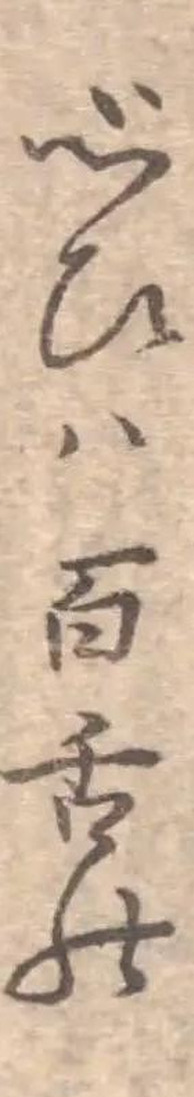思ひは百舌の
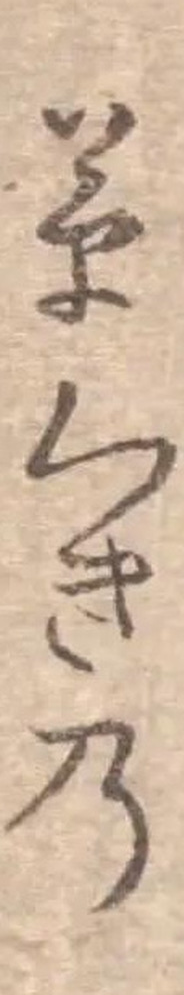草くきの
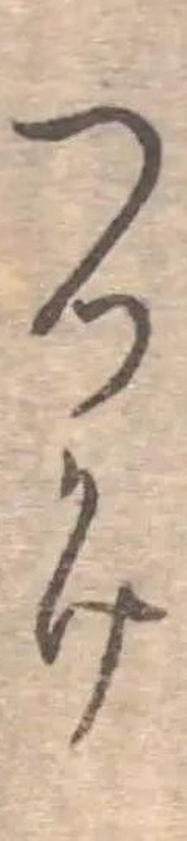つつかけ
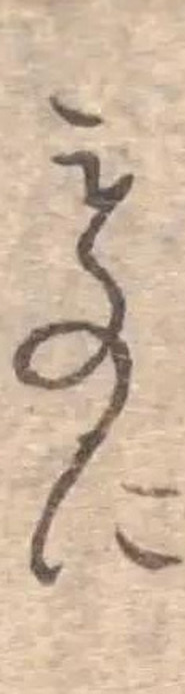ものに
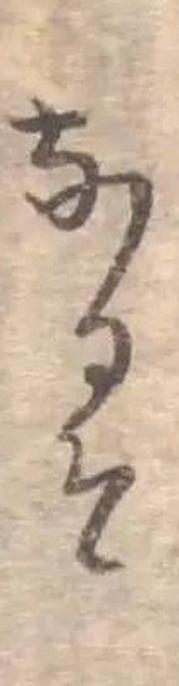なるそ
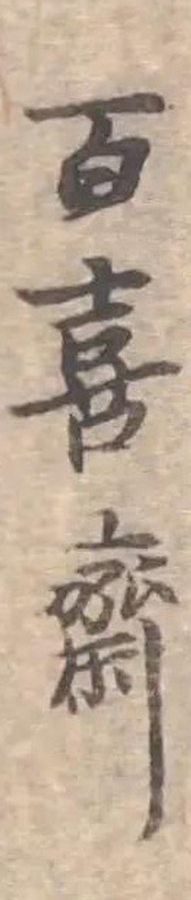百喜齋

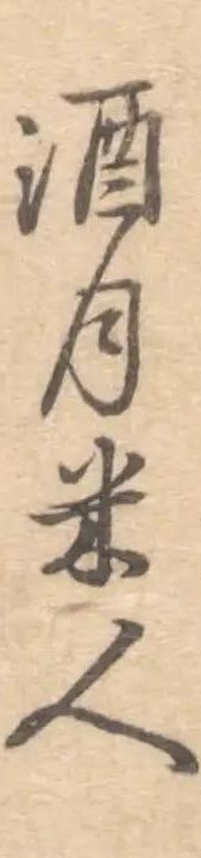酒月米人
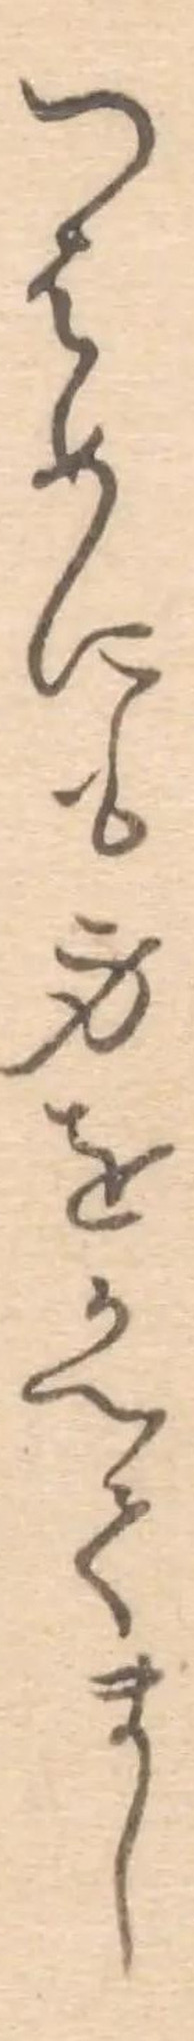つはめにも身をかへてまし
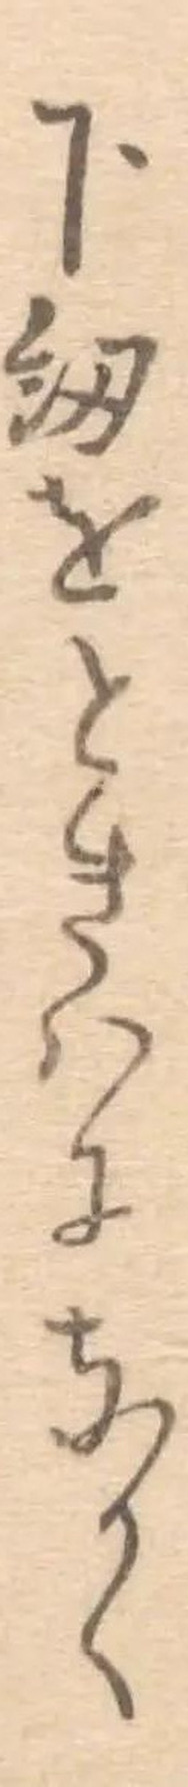下紐をときはになかく
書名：絵本百千鳥. 1
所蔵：国立国会図書館 National Diet Library, JAPAN
